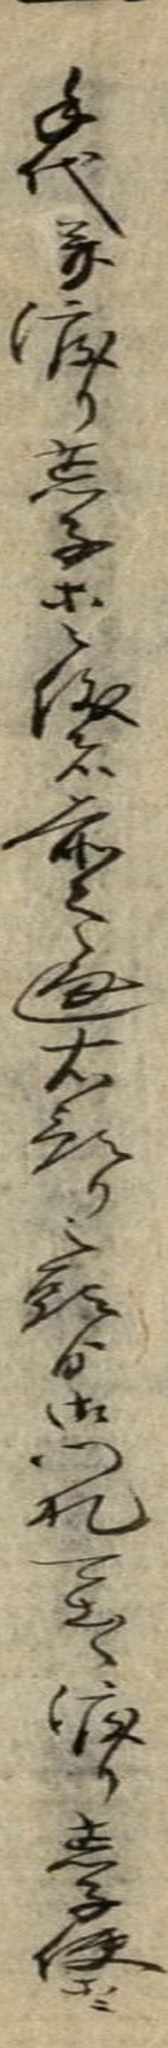一手代幷渡り荒子等之儀は前々之通右預り之頭ゟ御門札可出候渡り荒子使等に
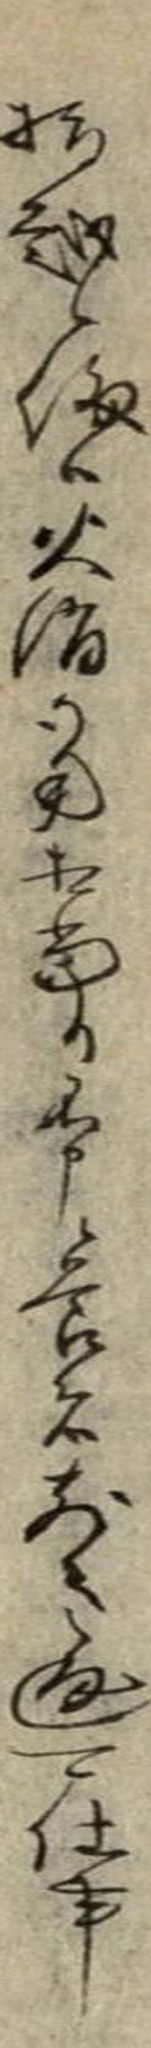指越候儀は火消御用相当り不申候節は前々之通可仕事
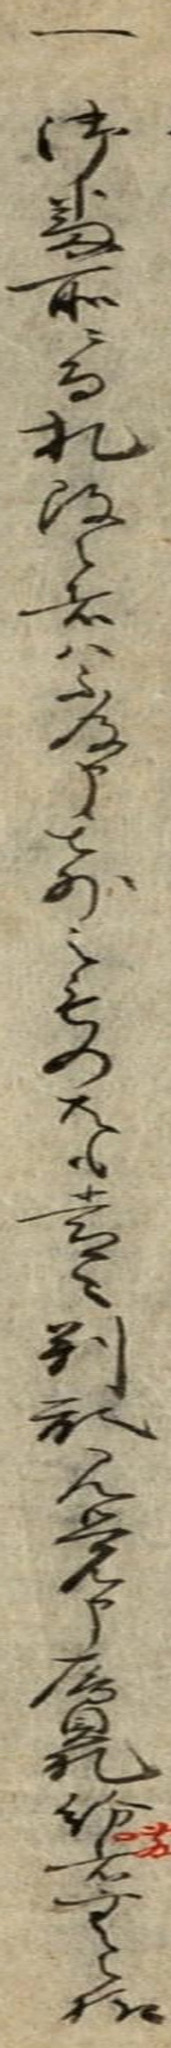一御番所にて札改候者は不及申其外之もの共も常々判形見覚申贋札紛敷者無之様
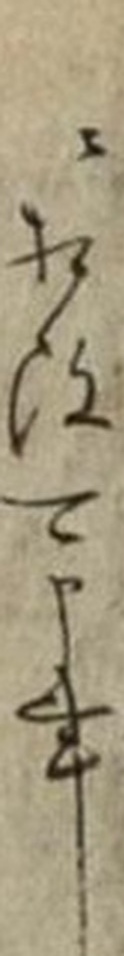に相改可申事
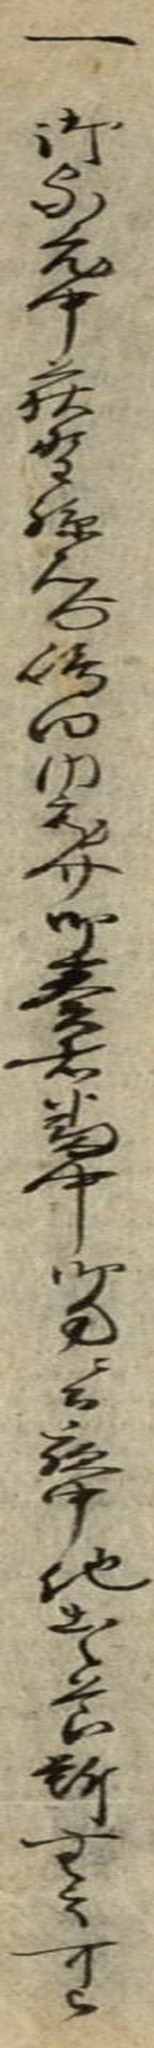一御家老中荻野孫右衛門嶋田内蔵介御奏者番中御用にて夜中他出之節断無之可被
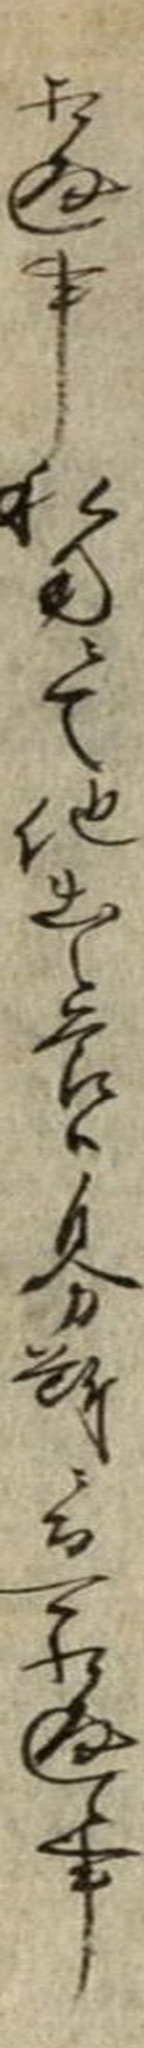相通事私用にて他出之節は自分断にて可相通候事
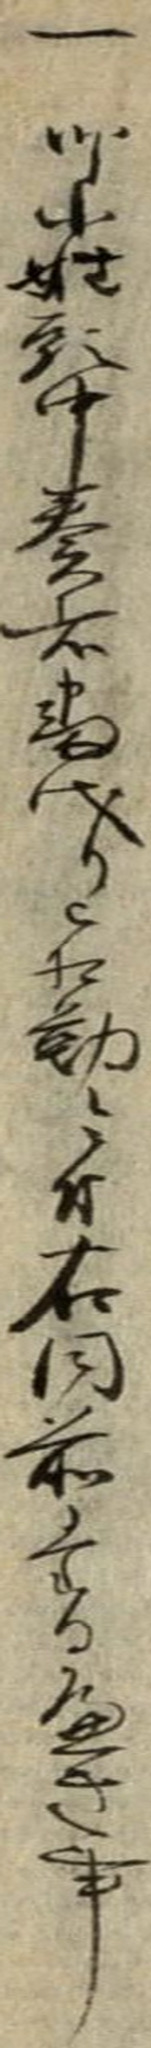一御小姓頭中奏者番代り被相勤候に付右同前たるへき事
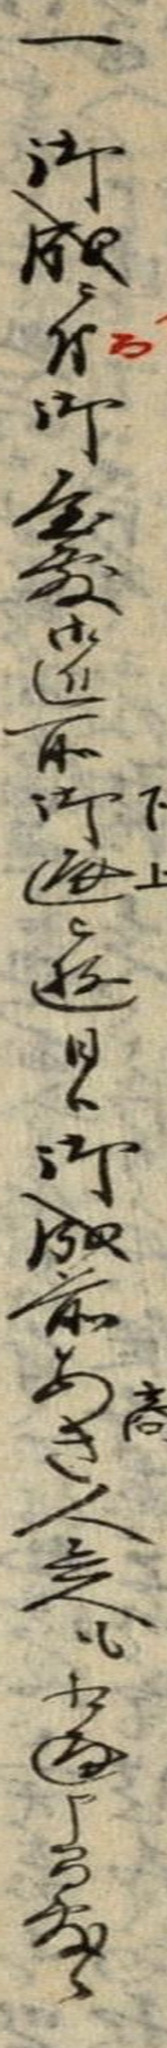一御成に付御屋敷御近所御通被遊日は御成前あき人壱人も相通申間敷候
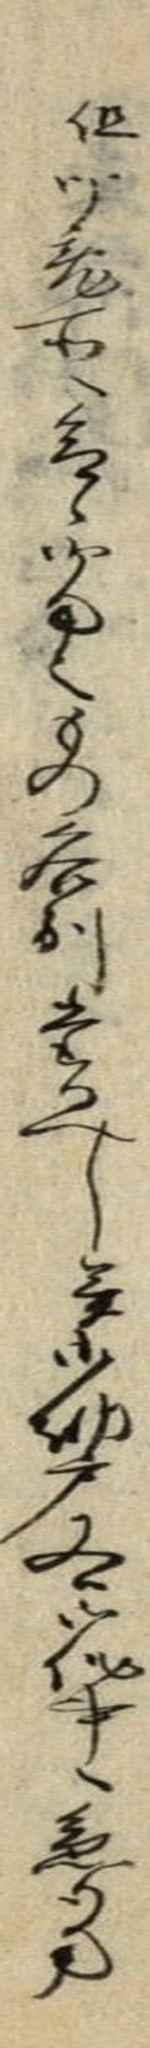但御台所へ参候御用之もの格別たるへし幷御納戸又は御作事へ急御用
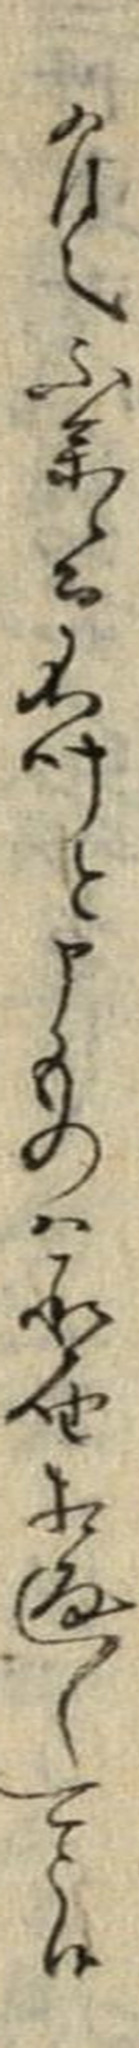有之不参候て不叶と申ものは承届相通し可申候
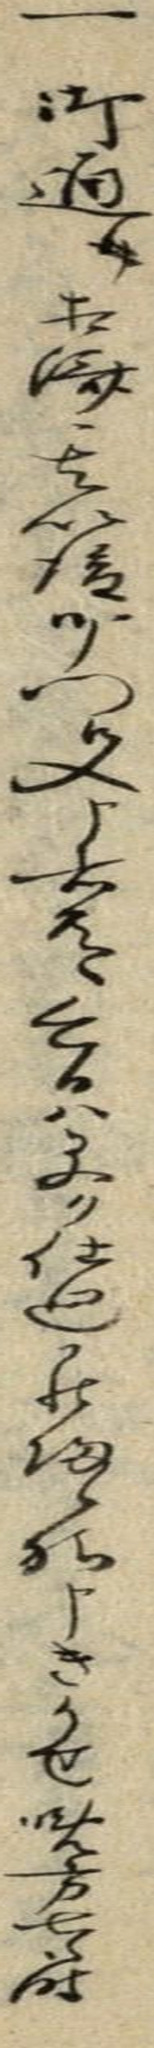一御通も相済其以後御門江入申者共へ今日は早く仕廻罷帰候様申きかせ晩方七ツ時
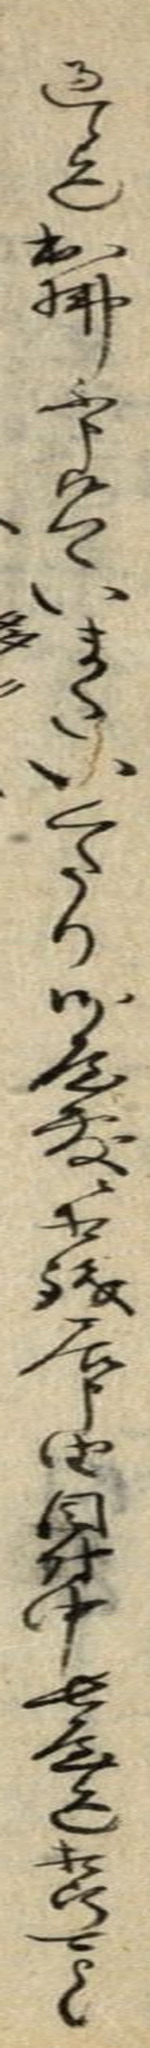過候迄出払不申候はゝいまたいくたり御屋敷に相残居申由目付中長屋迄相断可申候
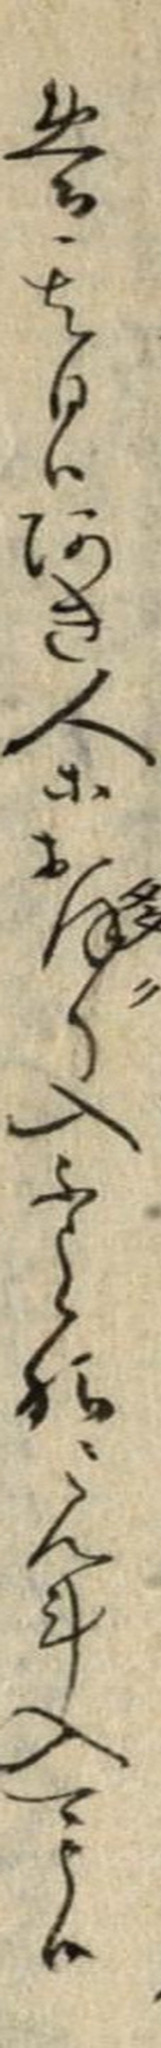惣て其日はあき人等おほく入不申候様に見計入可申候
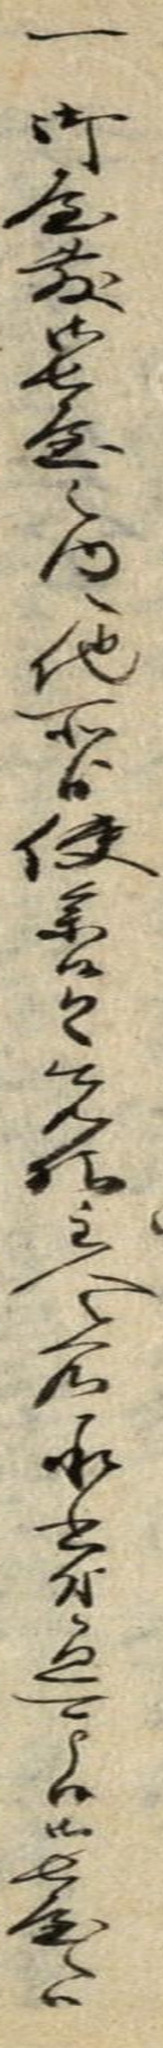一御屋敷御長屋之内へ他所ゟ使参候はゝ先様主人之名承書付置可申候御長屋へは
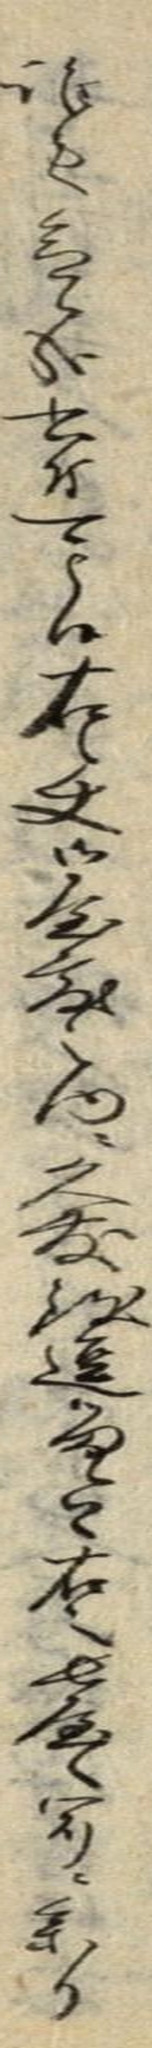誰方へ参候哉書付可申候右之使御屋敷之内に久敷致逗留候はゝ右之長屋へ聞に参り
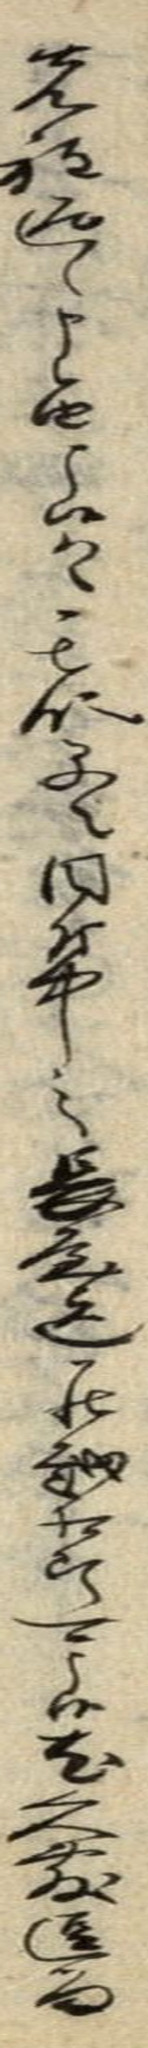先程返し申候由申候はゝ其段早々目付中之長屋迄罷越相断可申候尤久敷逗留
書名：三都并道中之部
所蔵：福井県文書館 Fukui Prefectural Archives
